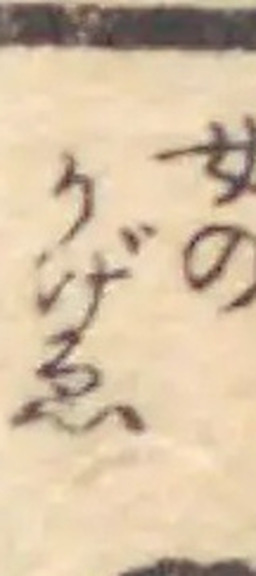かげゑ
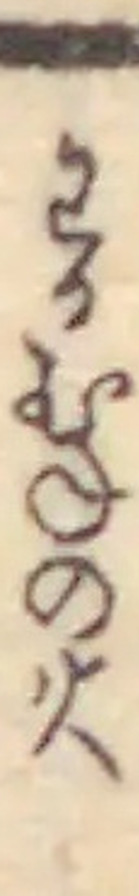わかむねの火
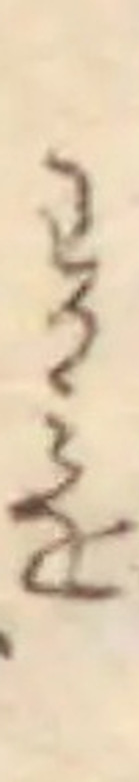わかみを
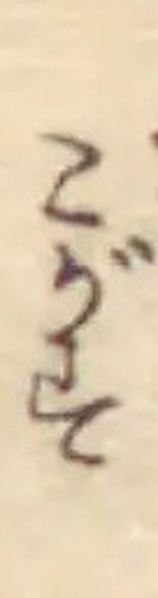こがす
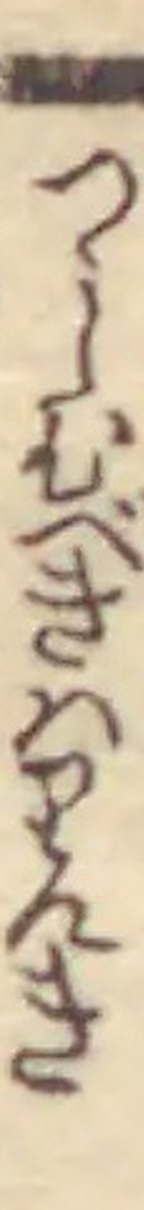つゝしむべきはりんき
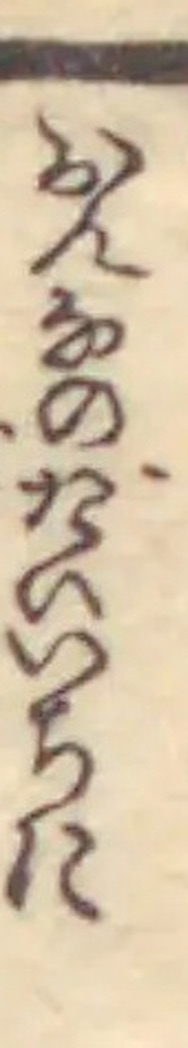おんなのだいいちに
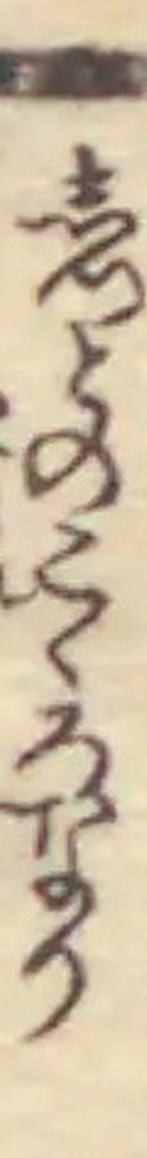しつとのこゝろなり
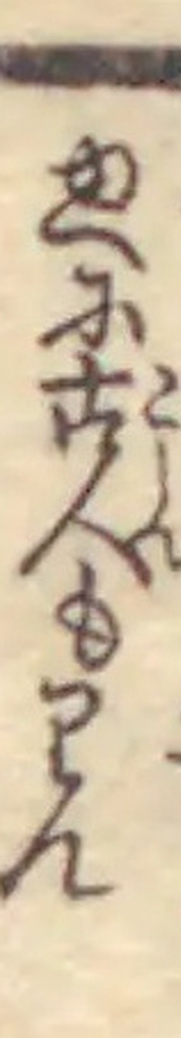ゆへに古人もりん
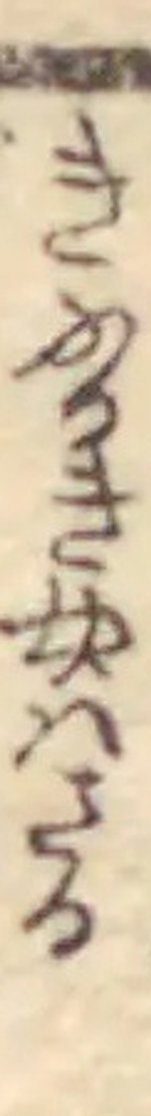きふかき女はさる
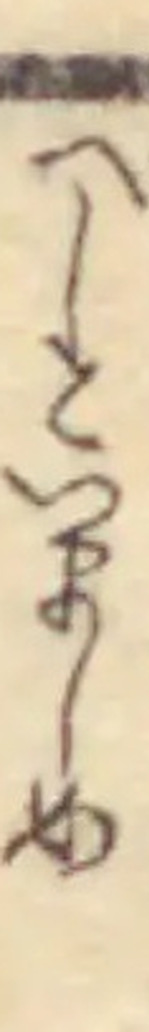べしといましめ
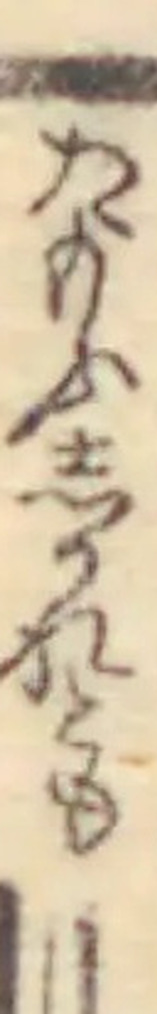たもふしかれとも
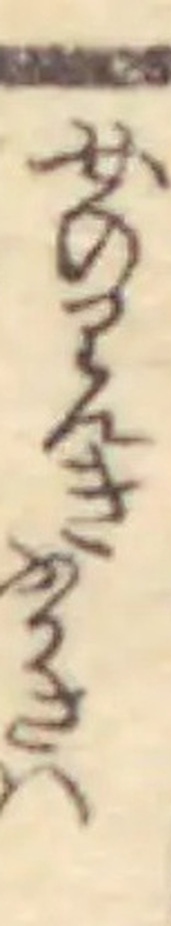女のりんきふかきは
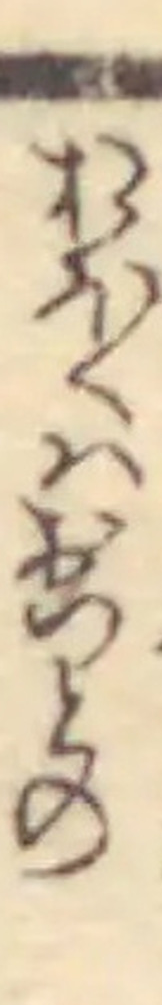おほくはおつとの
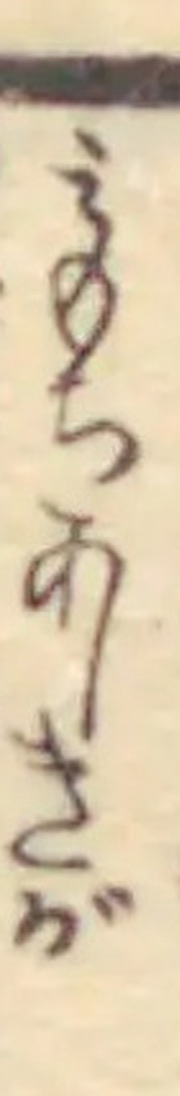みもちあしきが
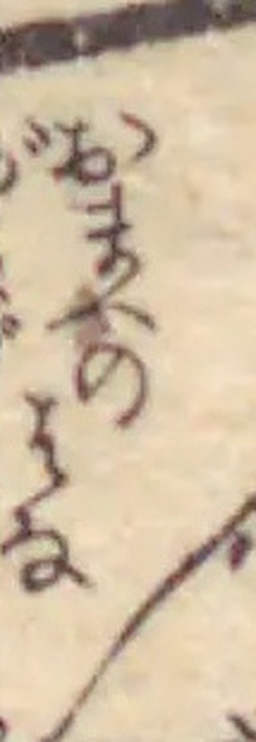おまへのはな
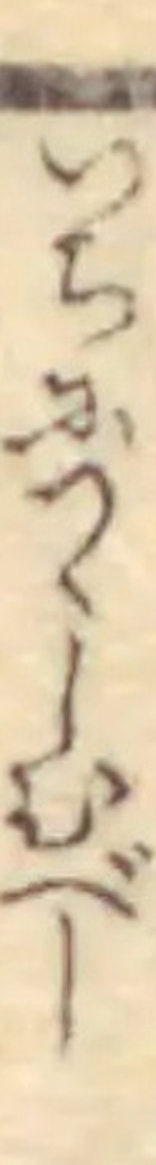いちにつゝしむべし
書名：児訓影絵喩 3巻
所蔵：国立国会図書館 National Diet Library, JAPAN
